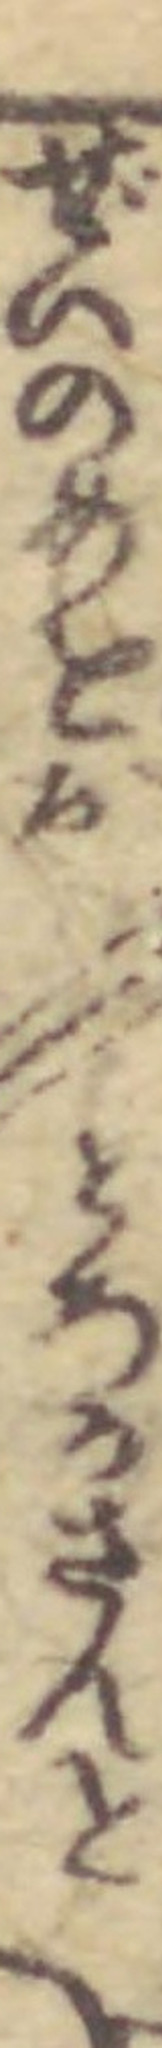ぜいのめをおとろかさんと
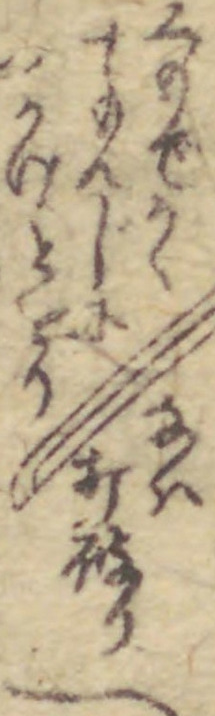かけとをり
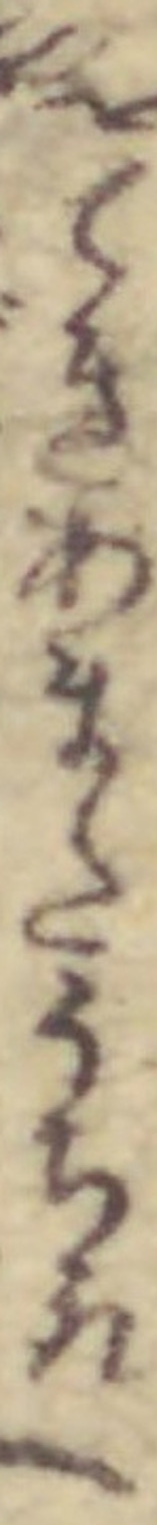てきあまたうち取
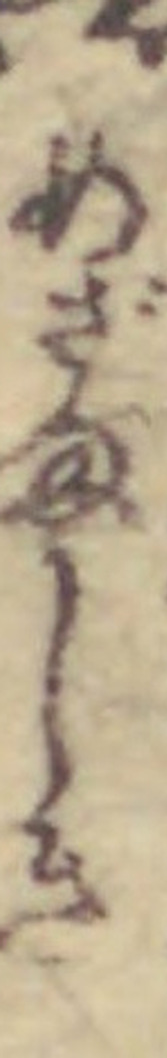めざましき
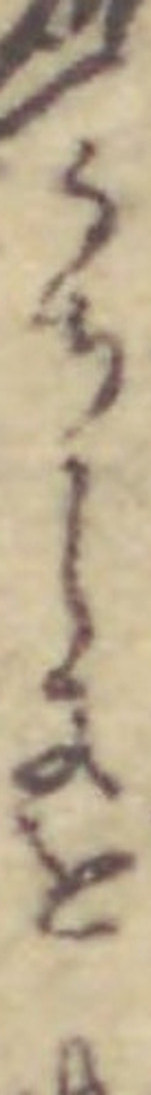うちしにを
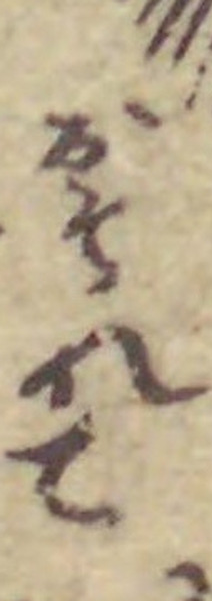おそれて
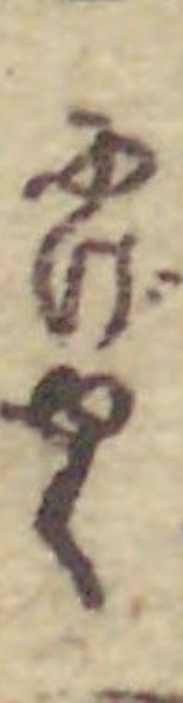にげゆく
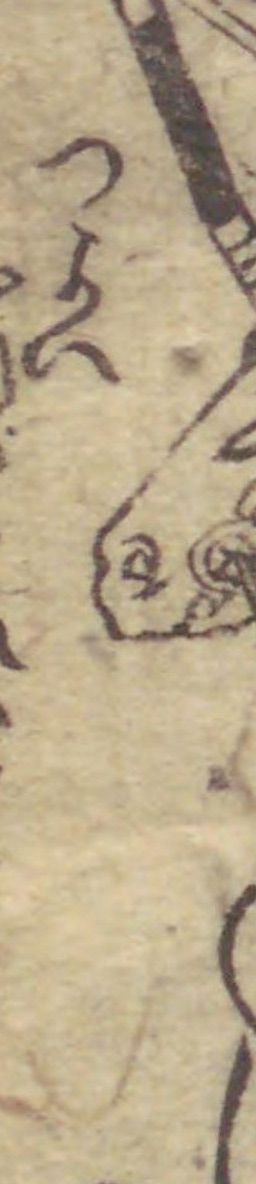つよい
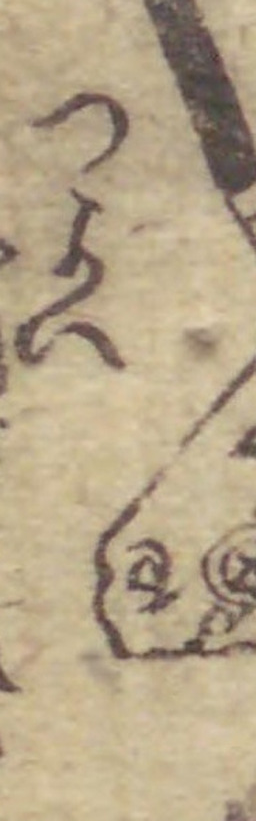つよい
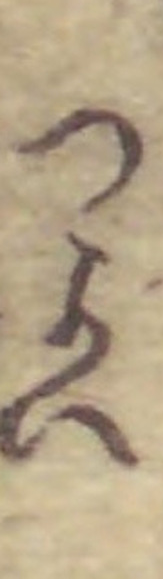つよい
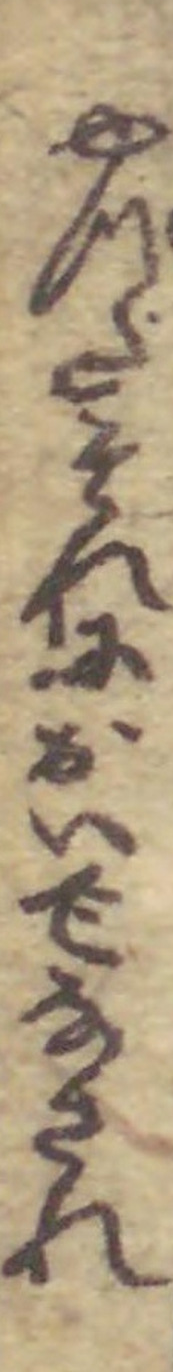やつだそれにおいでなされ

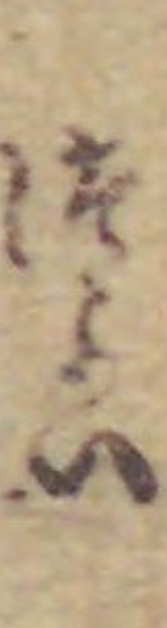つよい
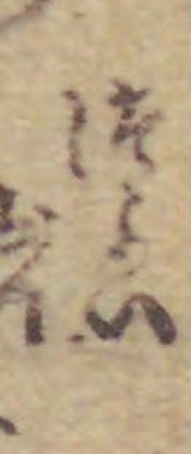つよい
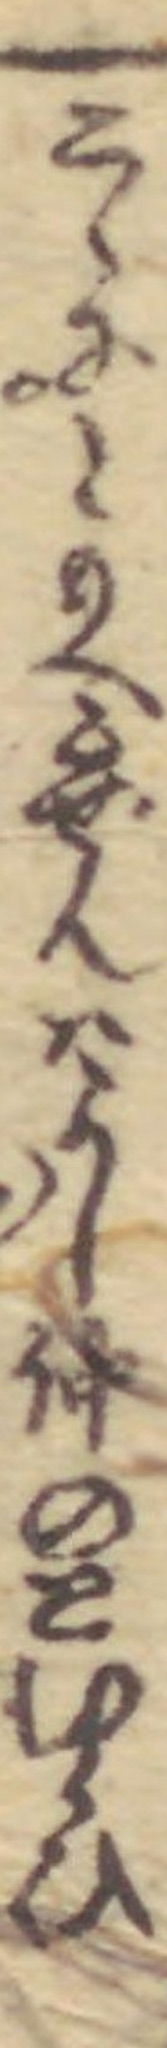こゝにともへこぜんはよし仲のとむらひ
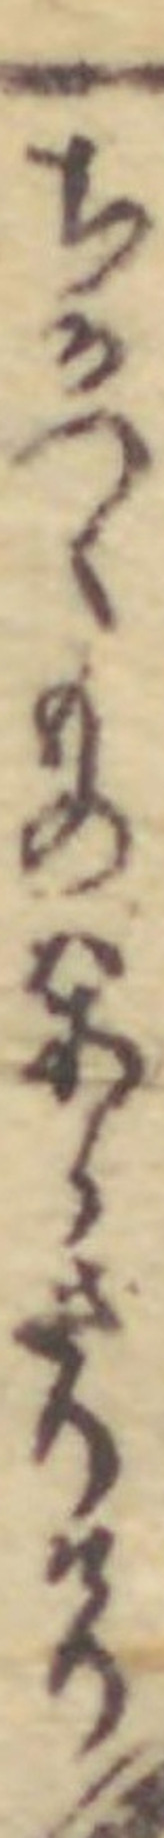ちかつくものはあらざりけり
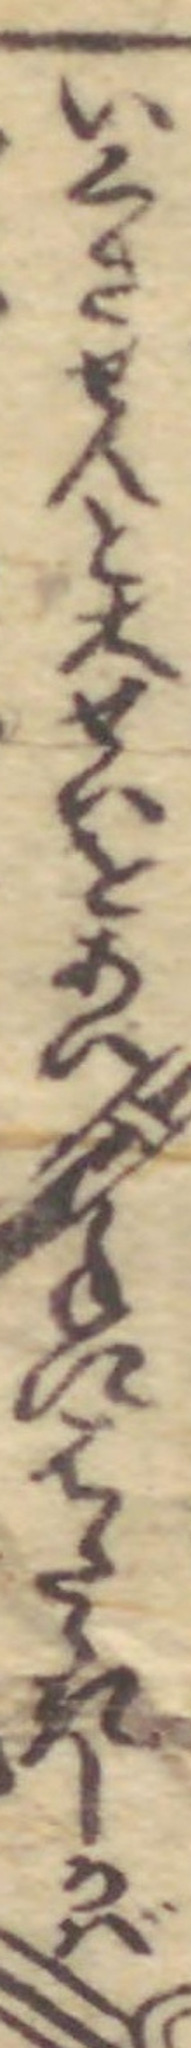いくさせんと大せいをあひ手にはたらきしかば
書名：朝比奈草摺実記 2巻
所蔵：国立国会図書館 National Diet Library, JAPAN
